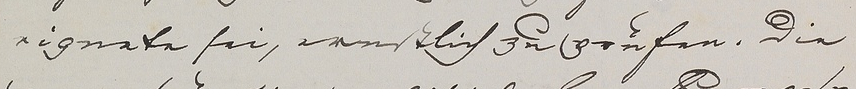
eignete sei, ernstlich zu prüfen. Die
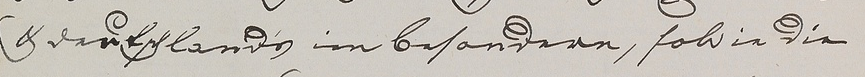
& Deutschland's im besondern, sowie die
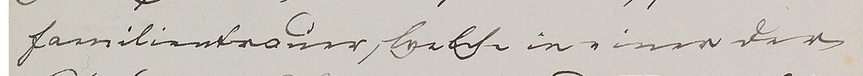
Familientrauer, welche in einer der
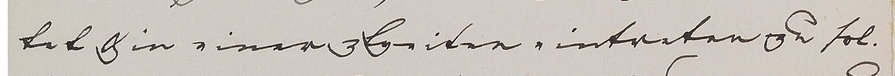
tet & in einer zweiten eintreten zu sol-
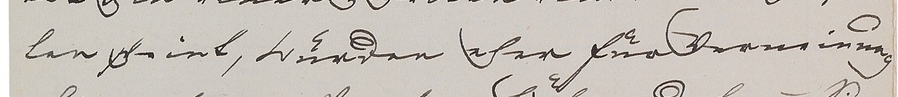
len scheint, würden eher für Verneinung
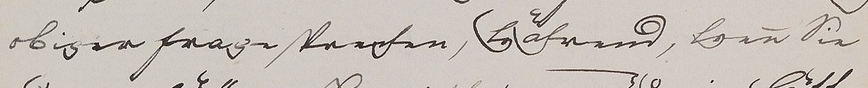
obiger Frage sprechen, während, wenn Sie
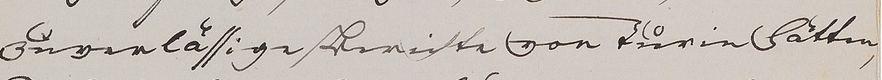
zuverlässige Berichte von Turin hätten,
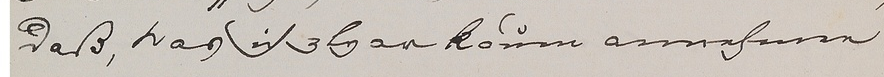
daß, was ich zwar kaum annehmen
